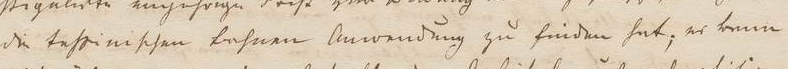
die tessinischen Bahnen Anwendung zu finden hat; es kann
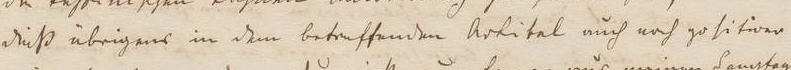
dieß übrigens in dem betreffenden Artikel auch noch positiver
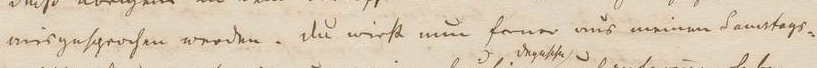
ausgesprochen werden. Du wirst nun ferner aus meinen Samstags-
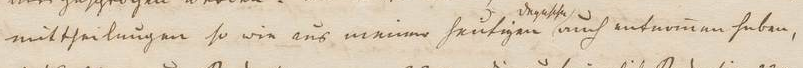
mittheilungen so wie aus meiner heutigenDepesche auch entnommen haben,
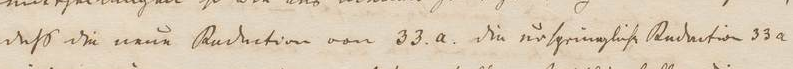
daß die neue Redaction von 33. .a die ursprüngliche Redaktion 33 a
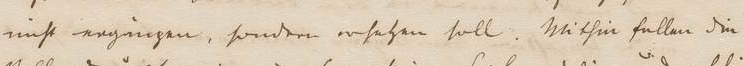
nicht ergänzen, sondern ersetzen soll. Mithin fallen die
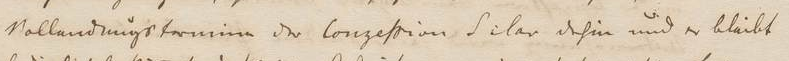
Vollendungstermine der Conzession Silar dahin und es bleibt
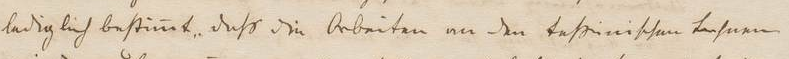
lediglich bestimmt, daß die Arbeiten an den tessinischen Bahnen
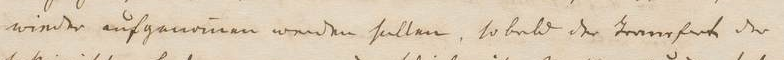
wieder aufgenommen werden sollen, so bald der Transport der
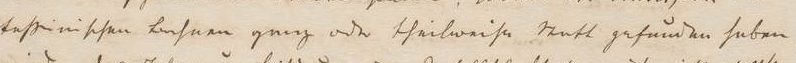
tessinischen Bahnen ganz oder theilweise Statt gefunden haben
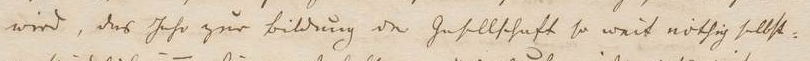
wird, das Jahr zur Bildung der Gesellschaft so weit nöthig selbst-
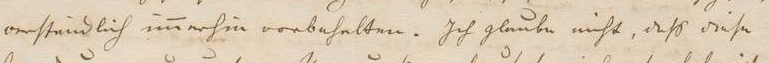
verständlich immerhin vorbehalten. Ich glaube nicht, daß diese
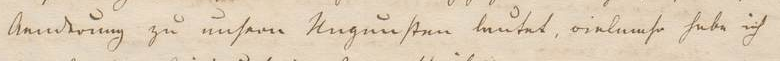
Aenderung zu unsern Ungunsten lautet, vielmehr habe ich
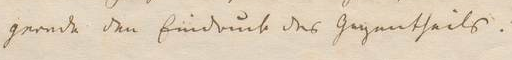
gerade den Eindruck des Gegentheils.
